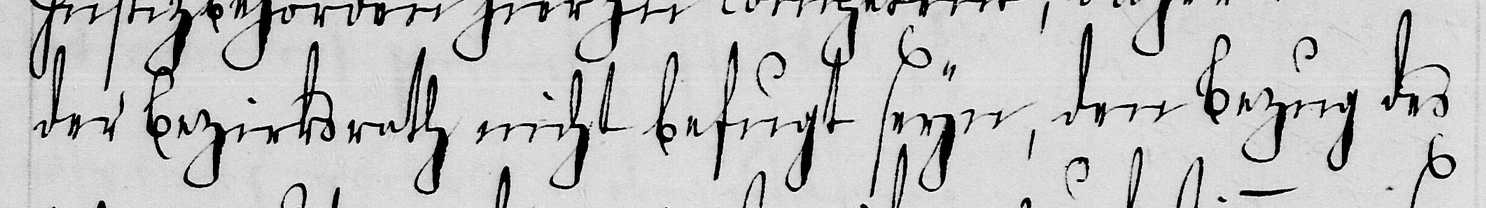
der Bezirksrath nicht befugt seyn, den Bezug des
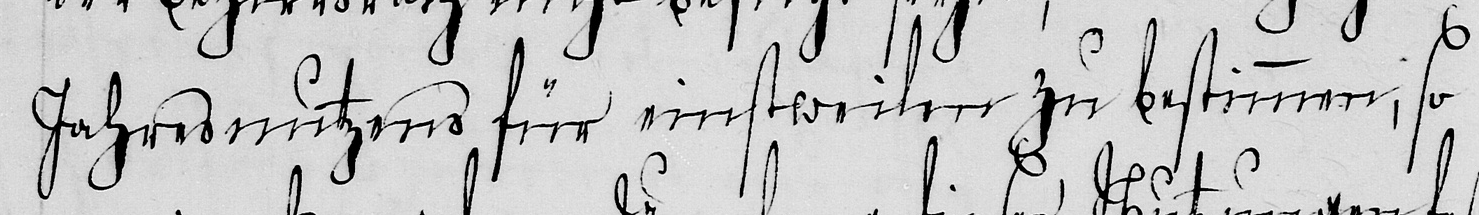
Jahresnutzens für einstweilen zu bestimmen, so
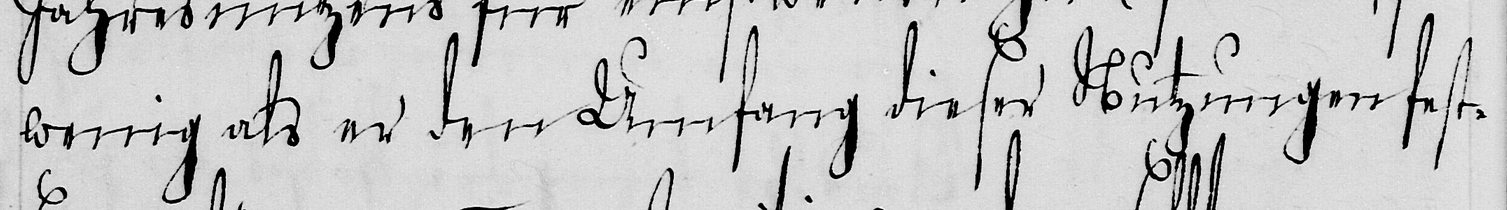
wenig als er den Umfang dieser Nutzungen fest¬
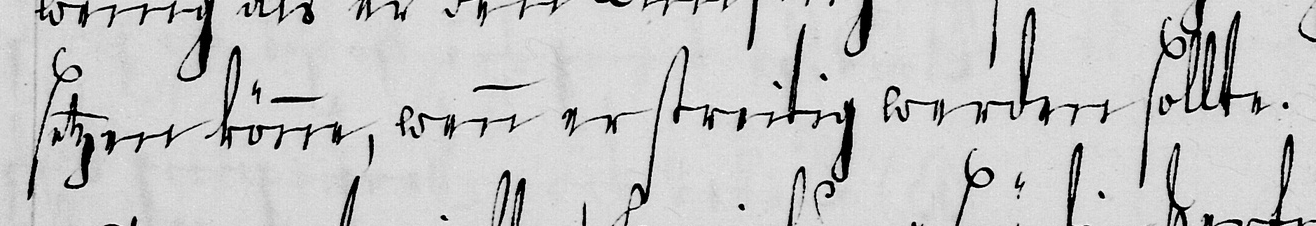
setzen könne, wenn er streitig werden sollte.
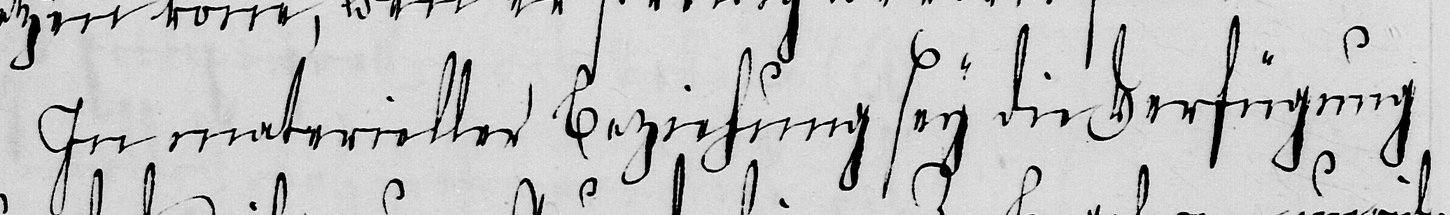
In materieller Beziehung sey die Verfügung
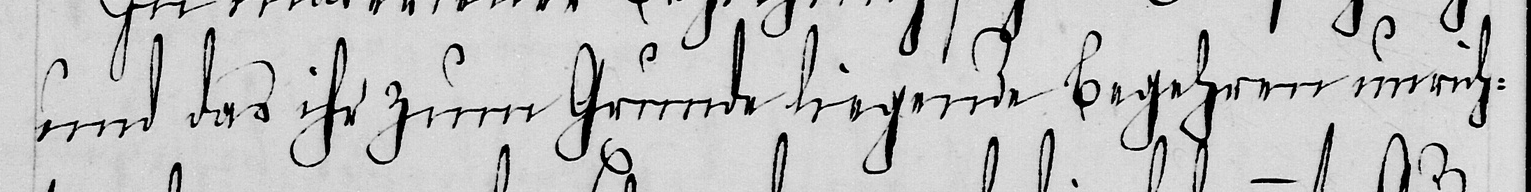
und das ihr zum Grunde liegende Begehren unrich¬
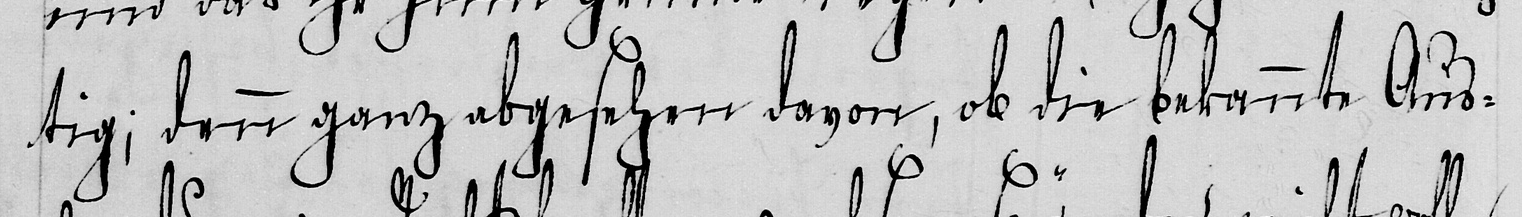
tig; denn ganz abgesehen davon, ob die bekannte Aus¬
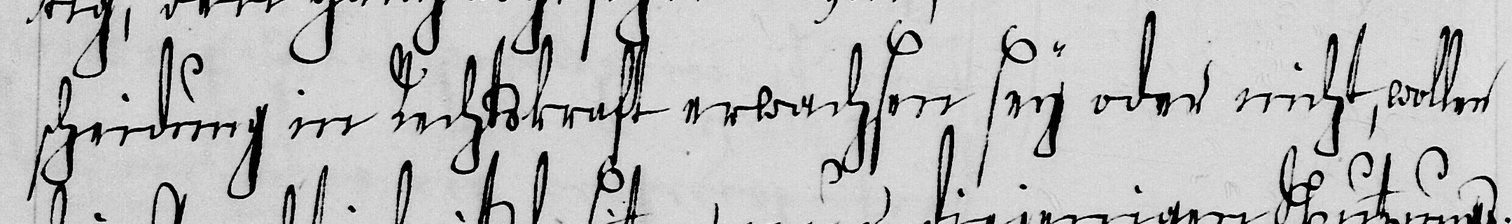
scheidung in Rechtskraft erwachsen sey oder nicht, woll¬
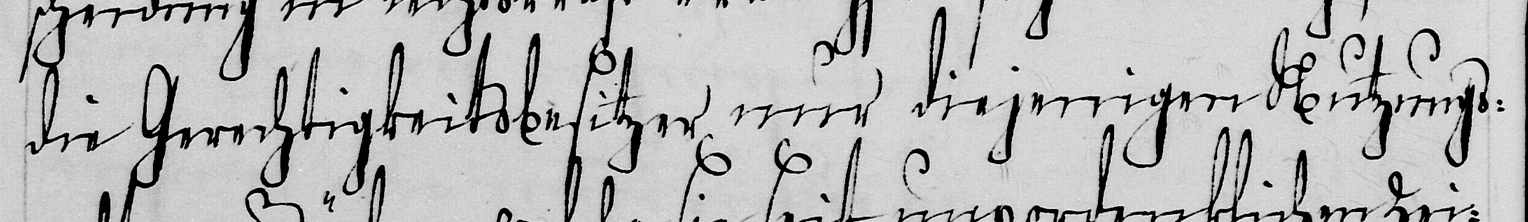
die Gerechtigkeitsbesitzer nur diejenigen Nutzungs¬
